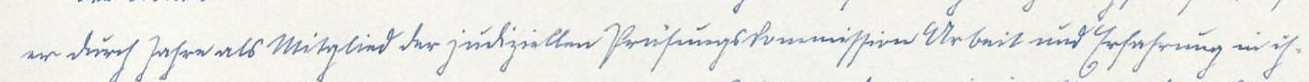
er durch Jahre als Mitglied der offiziellen Prüfungskommission Arbeit und Erfahrung in ich-
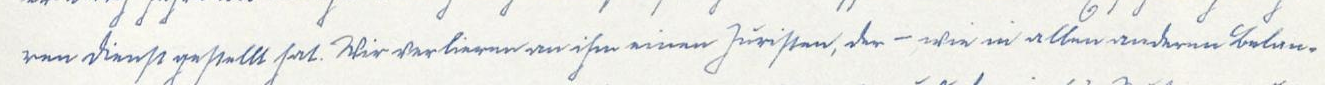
ren Dienst gestellt hat. Wir verlieren an ihm einen Juristen, der - wie in allen anderen Belan-
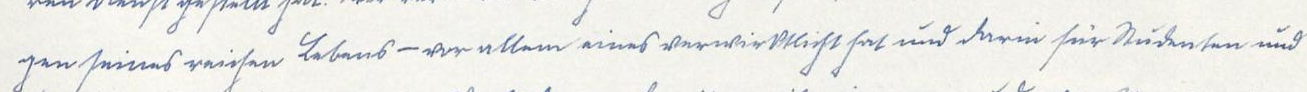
gen seines reichen Lebens - vor allem eines verwirklicht hat und darin für Studenten und
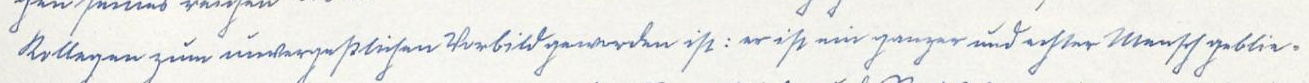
Kollegen zum unvergeßlichen Vorbild geworden ist: er ist ein ganzer und echter Mensch geblie-
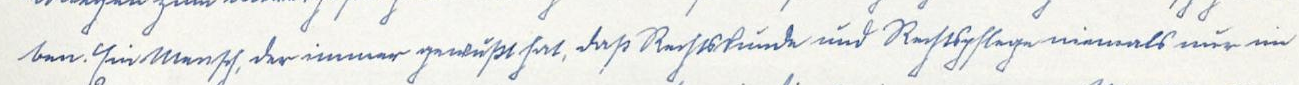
ben. Ein Mensch, der immer gewußt hat, dass Rechtskunde und Rechtspflege niemals nur im
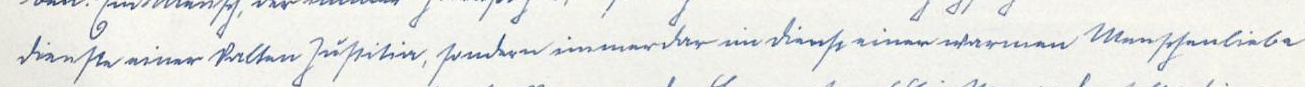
Dienste einer kalten Justitia, sondern immerdar im Dienste eines einer warmen Menschenliebe
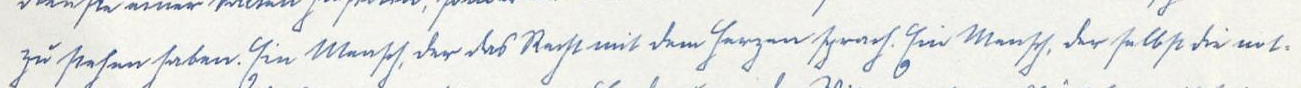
zu stehen haben. Ein Mensch, der das Recht mit dem Herzen sprach. Ein Mensch, der selbst die not-
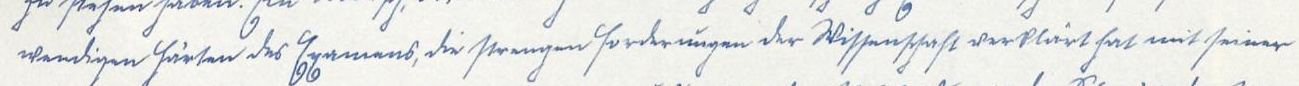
wendigen Härten des Examens, die strengen Forderungen der Wissenschaft erklärt hat mit seiner
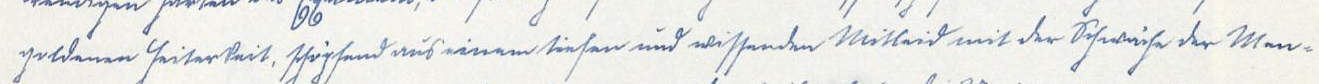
goldenen Heiterkeit, schöpfend aus einem tiefen und wissenden Mitleid mit der Schwäche der Men-
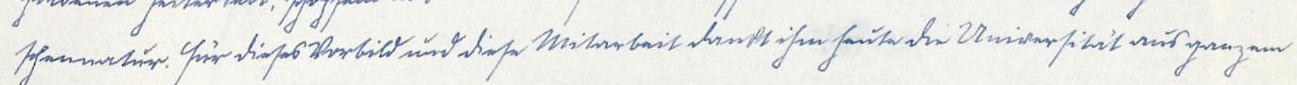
schennatur. Für dieses Vorbild und diese Mitarbeit dankt ihm heute die Universität aus ganzem
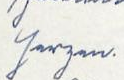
Herzen.
